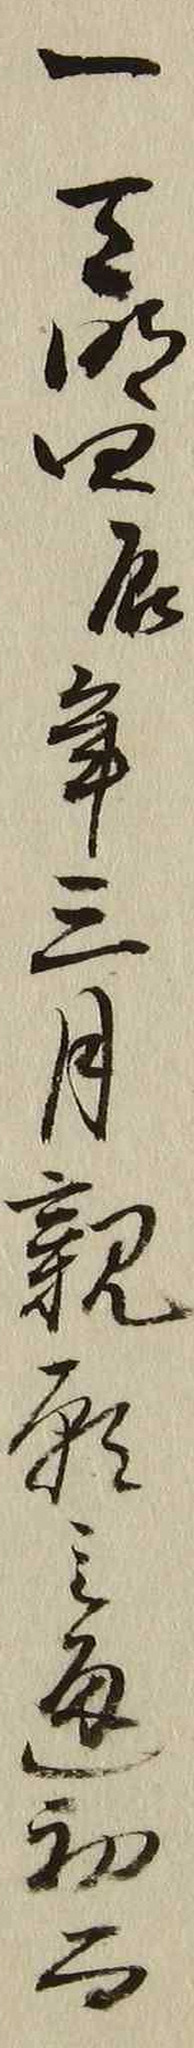一天明四辰年三月親願之通初而
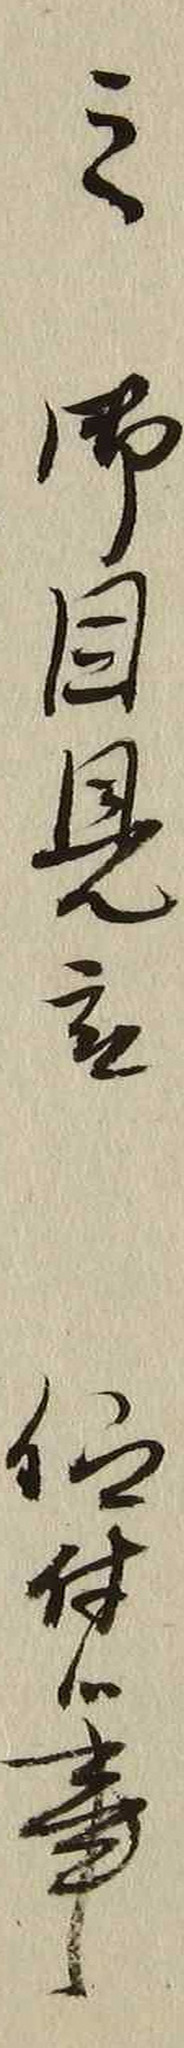之御目見被仰付候事
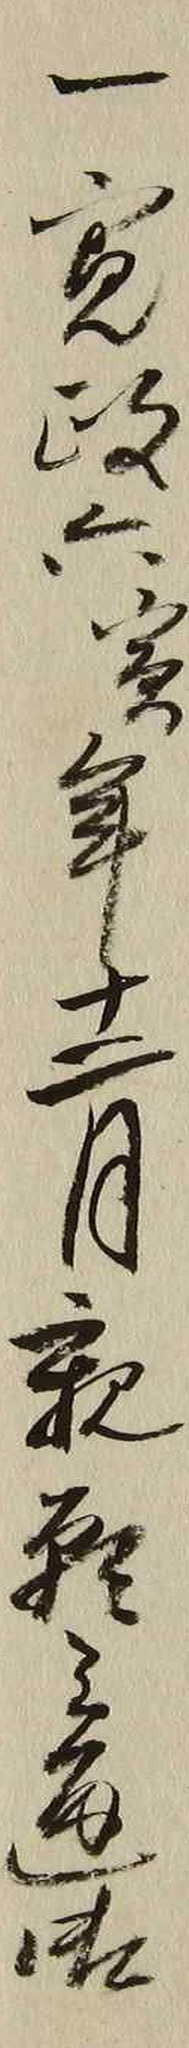一寛政六寅年十二月親願之通御
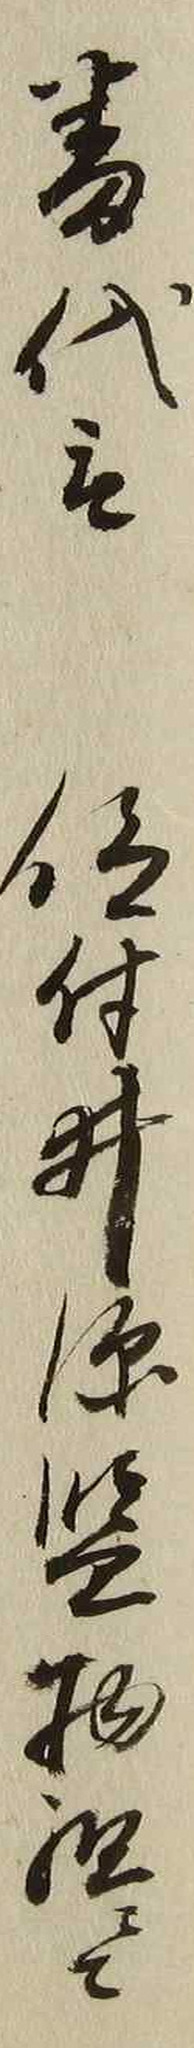番代被仰付井深監物組ニ而
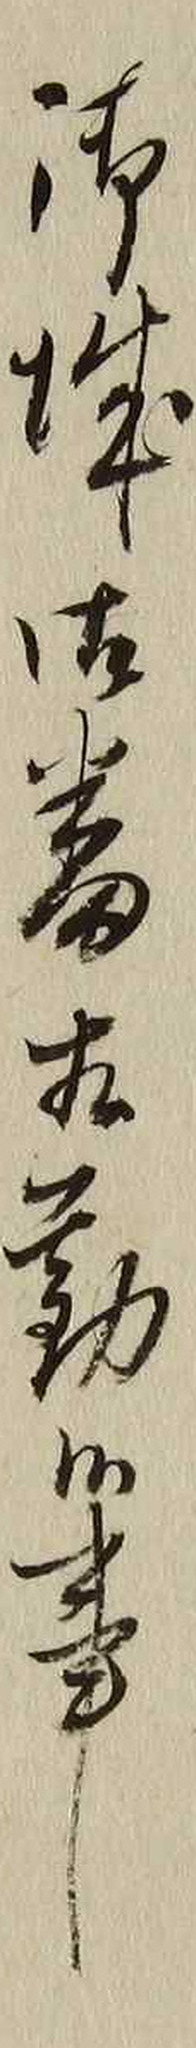御城御番相勤候事
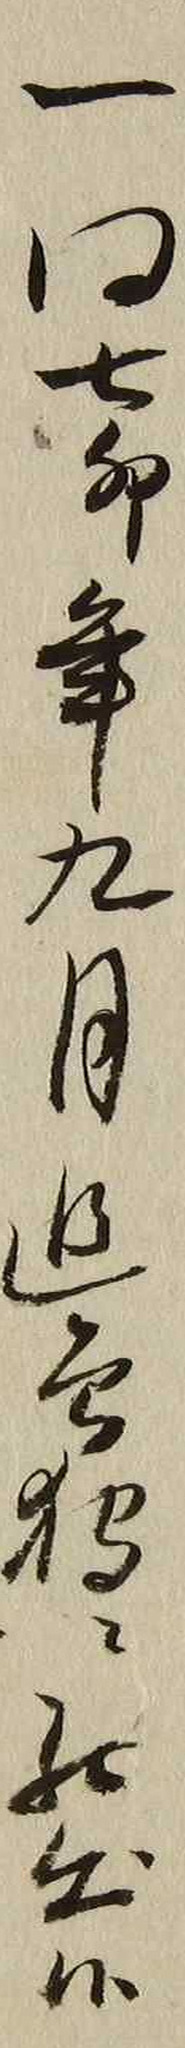一同七卯年九月追鳥狩ニ罷出候
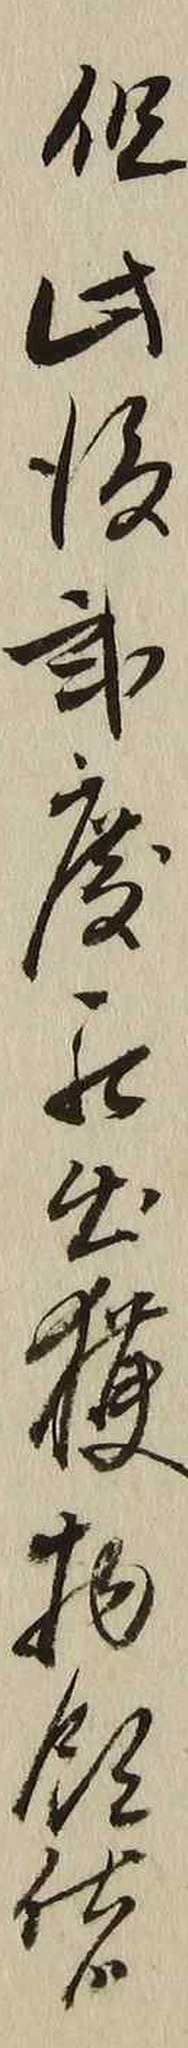但此後弐度罷出獲物領仕候
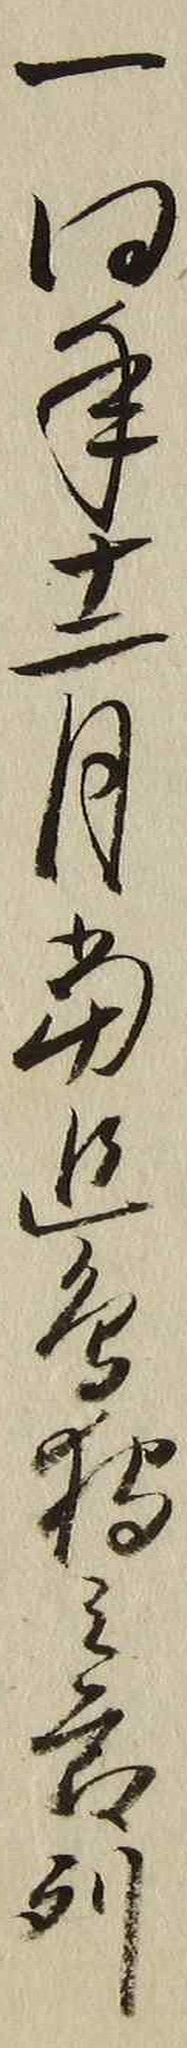一同年十二月当追鳥狩之節列
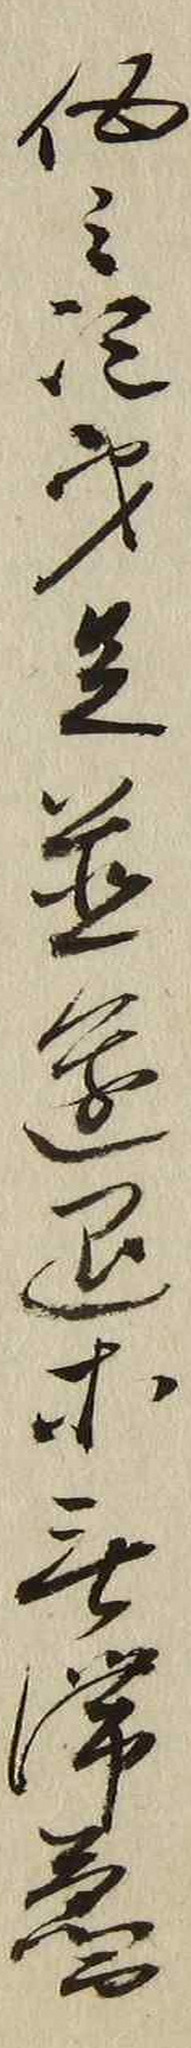伍之次第足並進退等無滞兼而
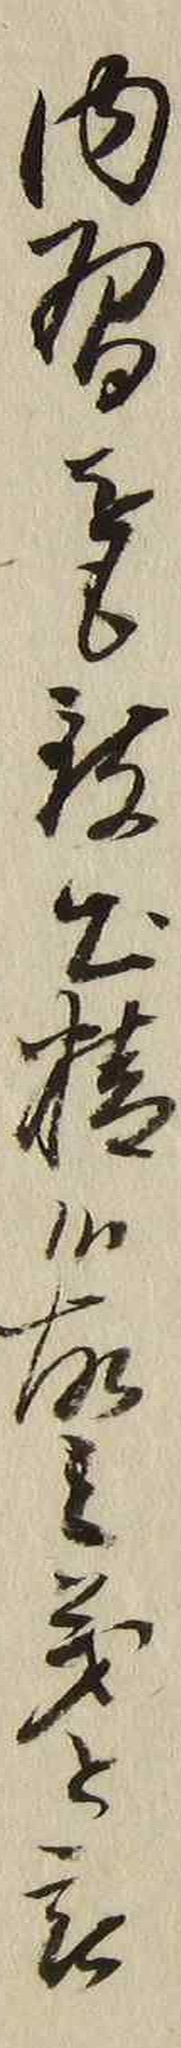内習をも致出精候故之義と被
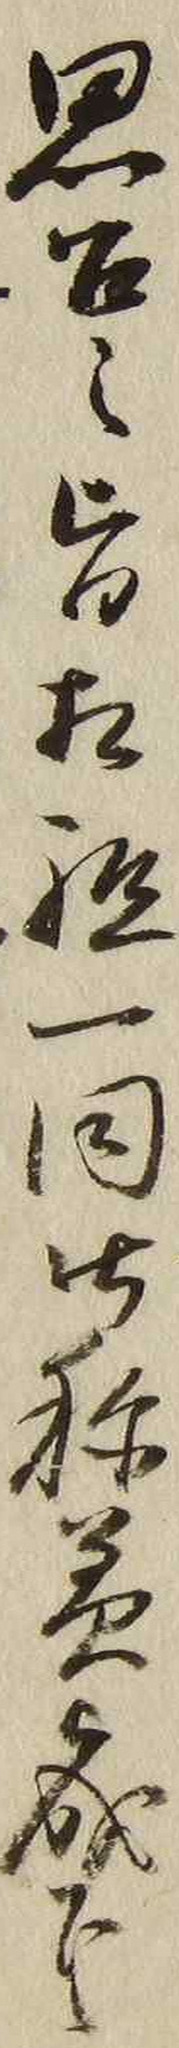思召之旨相組一同御称美被成下候
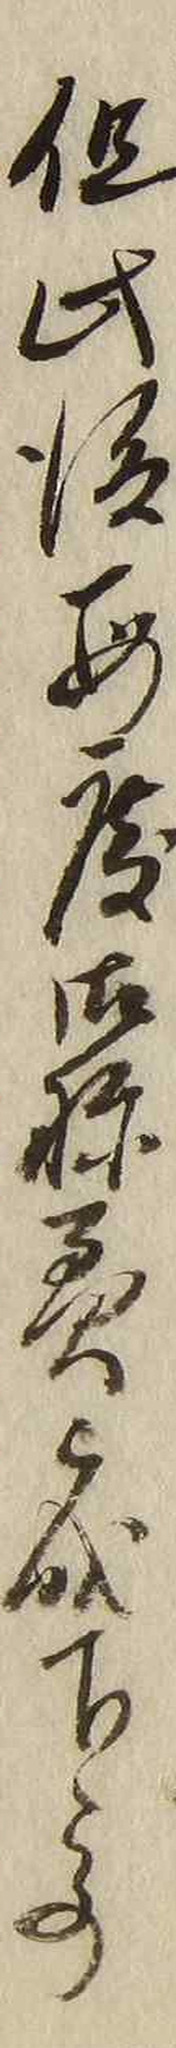但此後数度御称美被成下候事

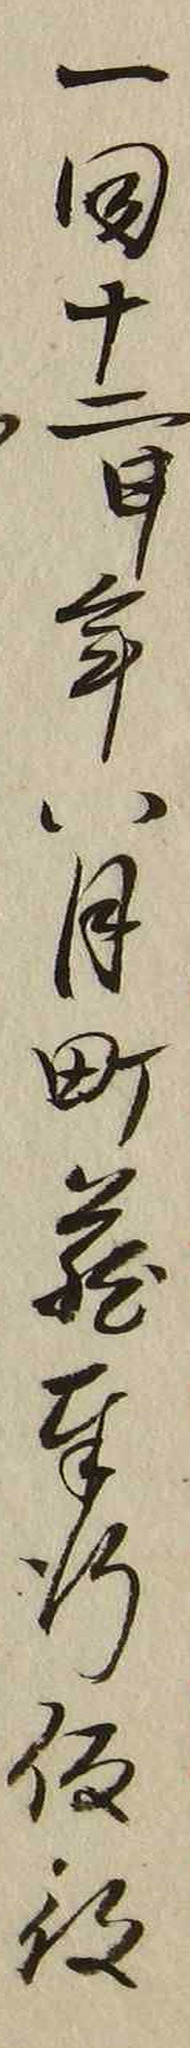一同十二申年八月町蔵奉行仮役
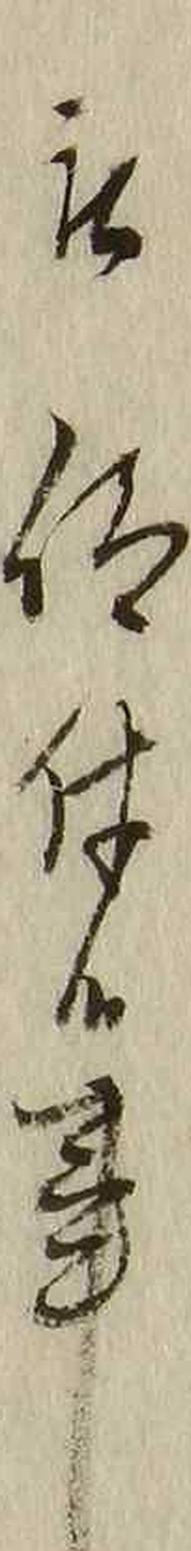被仰付候事
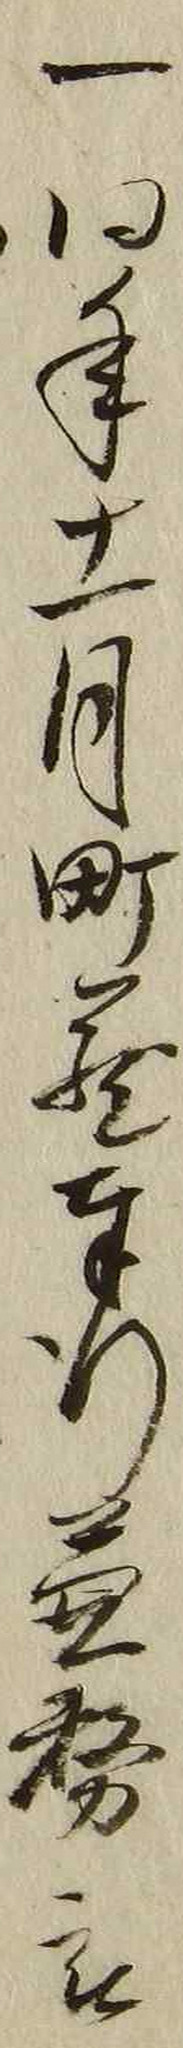一同年十一月町蔵奉行兼務被
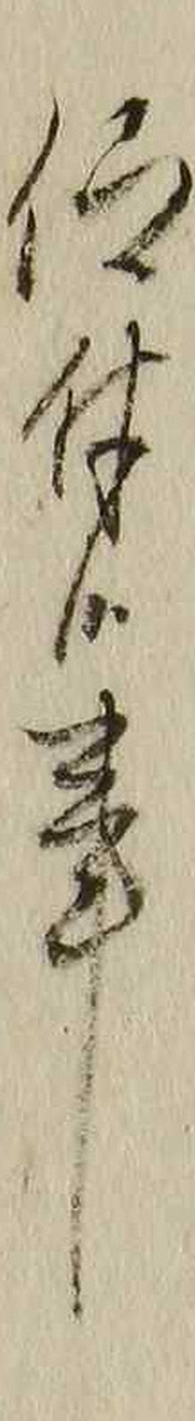仰付候事
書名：諸士系譜　巻之352　す之部2
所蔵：会津若松市立会津図書館
